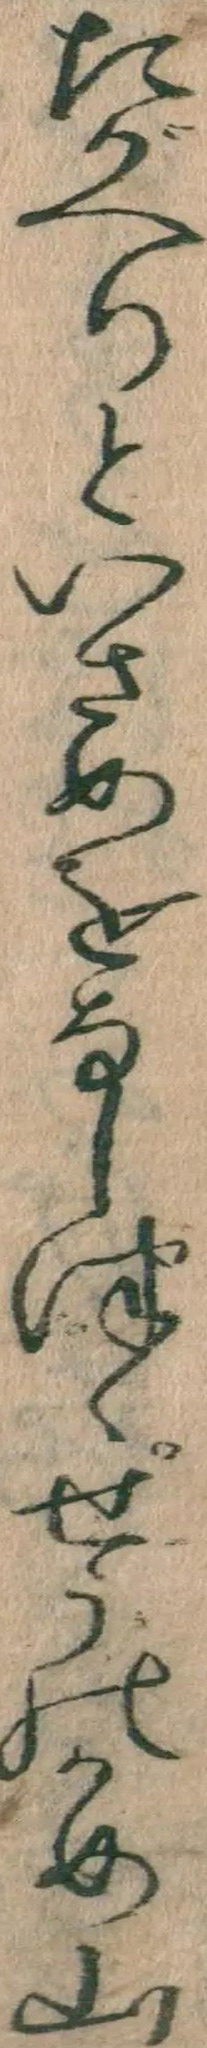たがへりといさめをなしつゝ。せうのかめ山
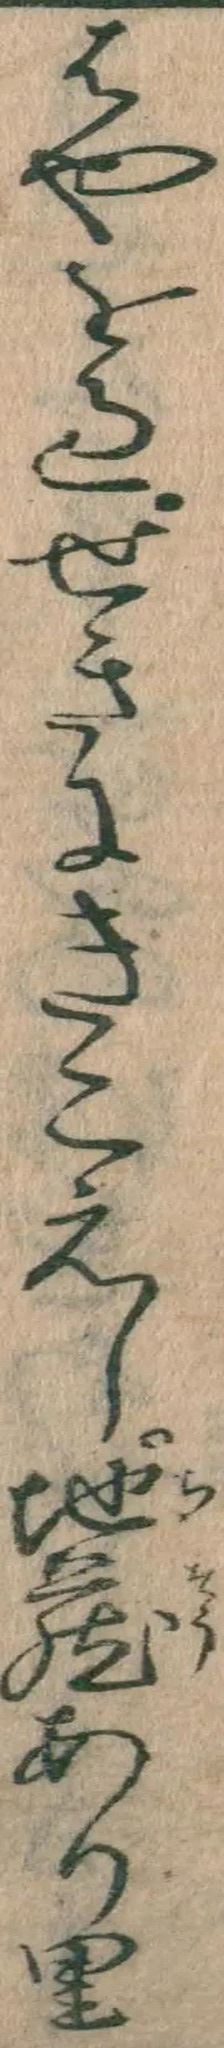はやを過、せきにきこえし。地蔵あり里
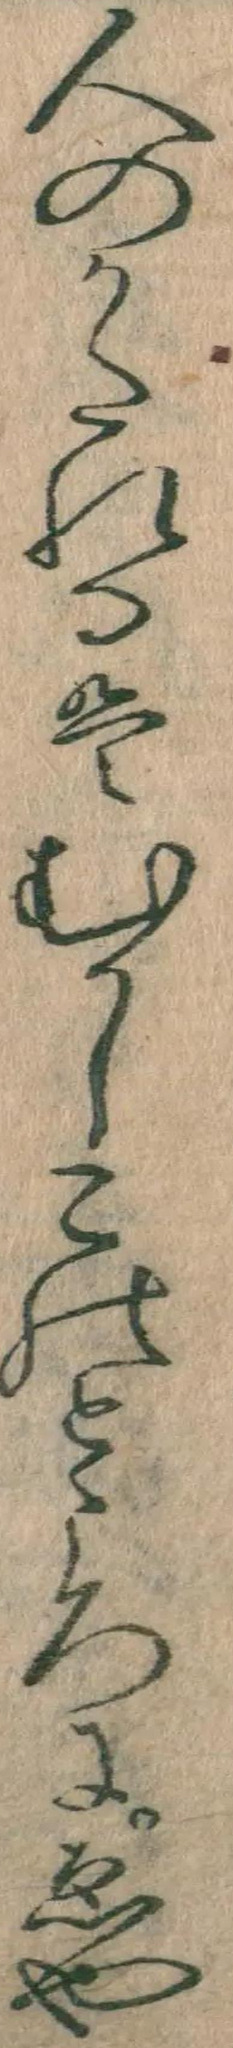人のかたれるはむかしこのところに。ゑや
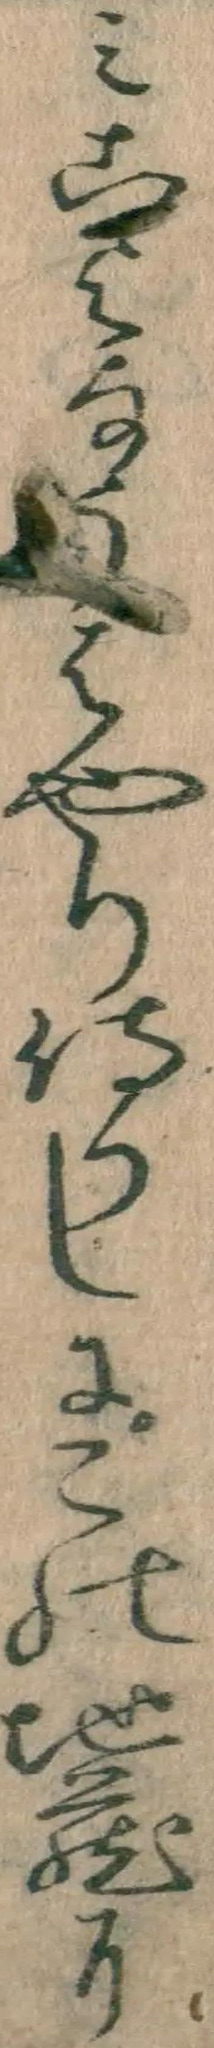みこよなうはやり侍りしに。この地蔵に
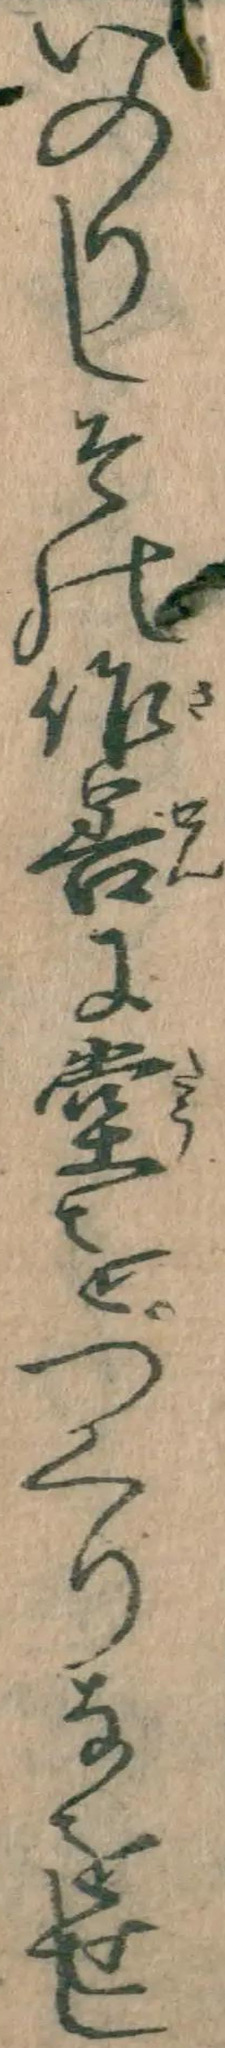いのりしその作善に堂を。つくりなをせし

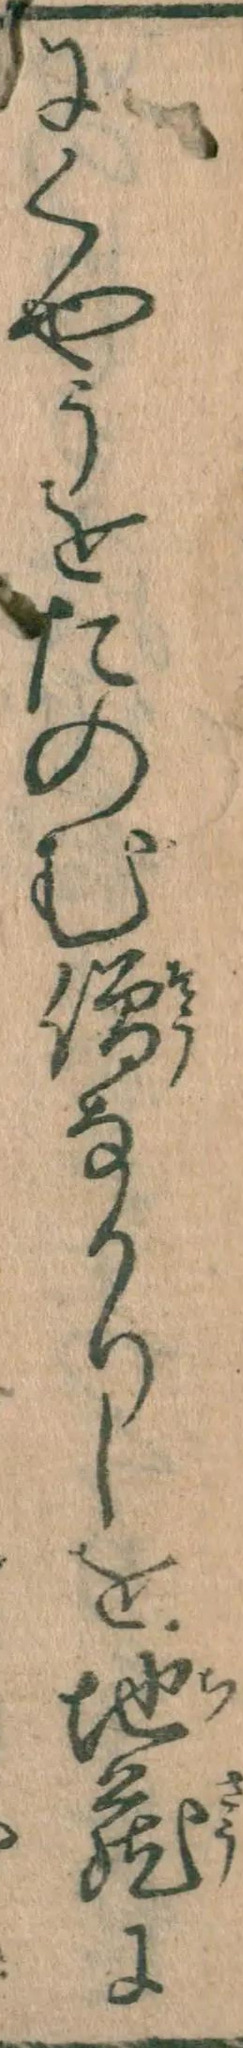にくやうをたのむ僧なかりしを地蔵に
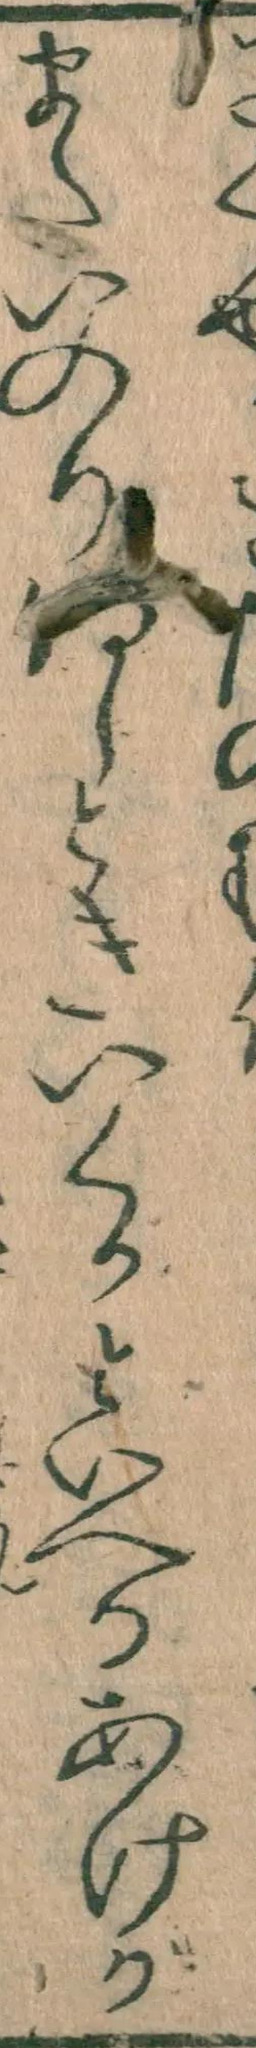またいのり侍しときいくかといへるあけが
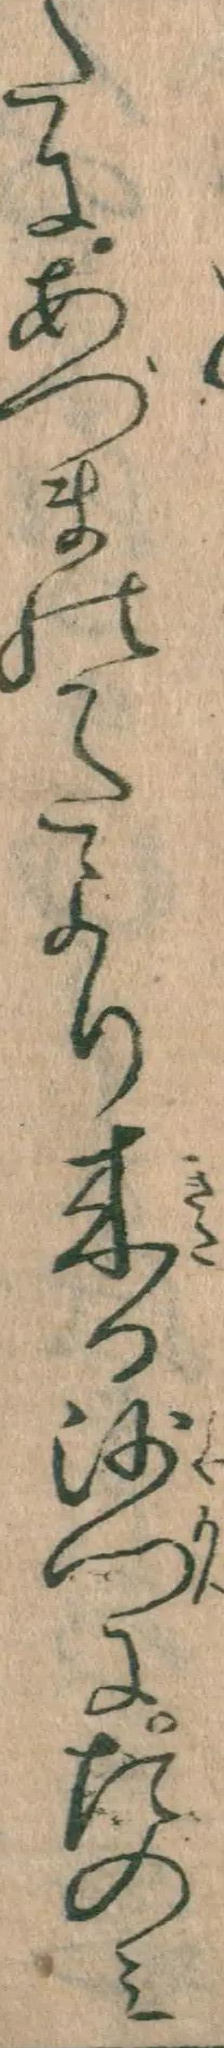たに、あつまのかたより来る沙門に。たのみ
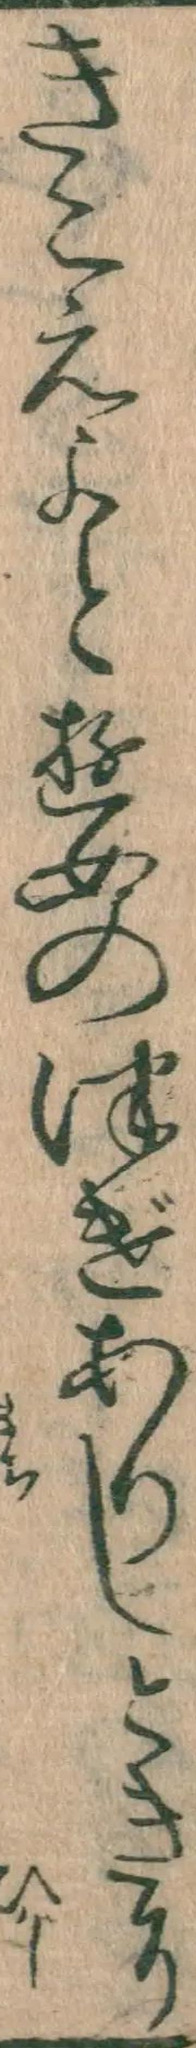きこえよと遊女のつげありしときに
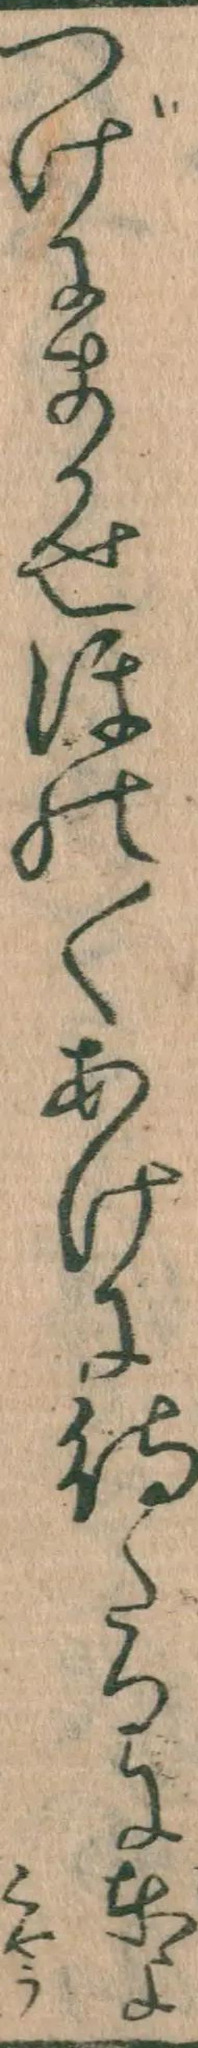つげにまかせほの〳〵あけに待たるに東よ
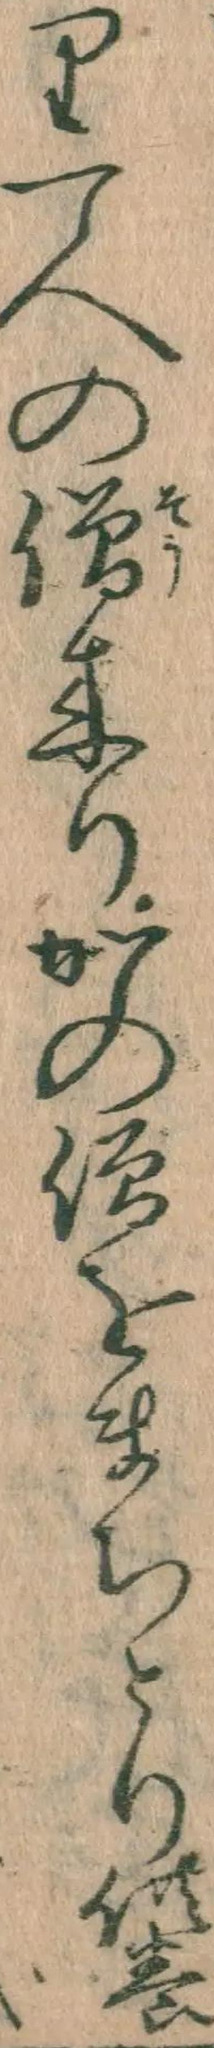り一人の僧来り、かの僧をまちとり供養
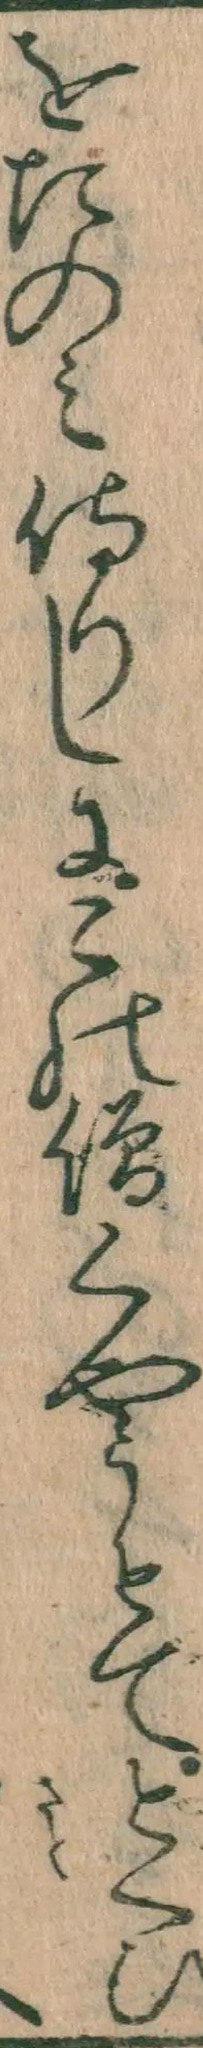をたのみ侍りしに、この僧くやうとて、とくび
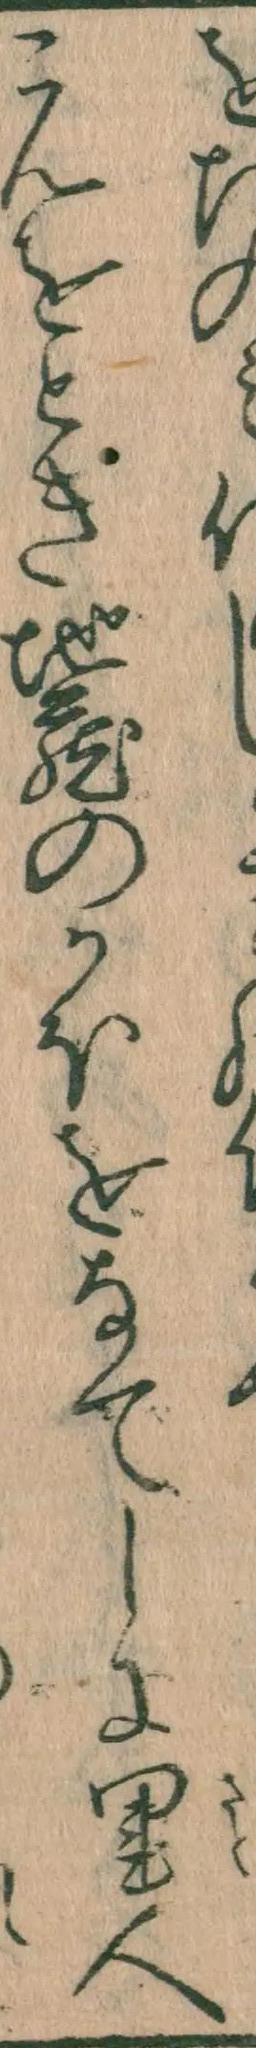こんをとき地蔵のかほをなてしに里人
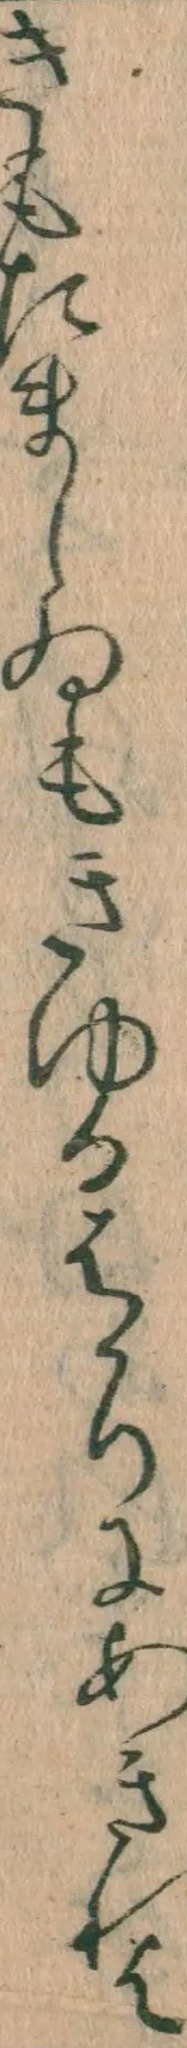きもたましゐもきゆるはかりにあきれは
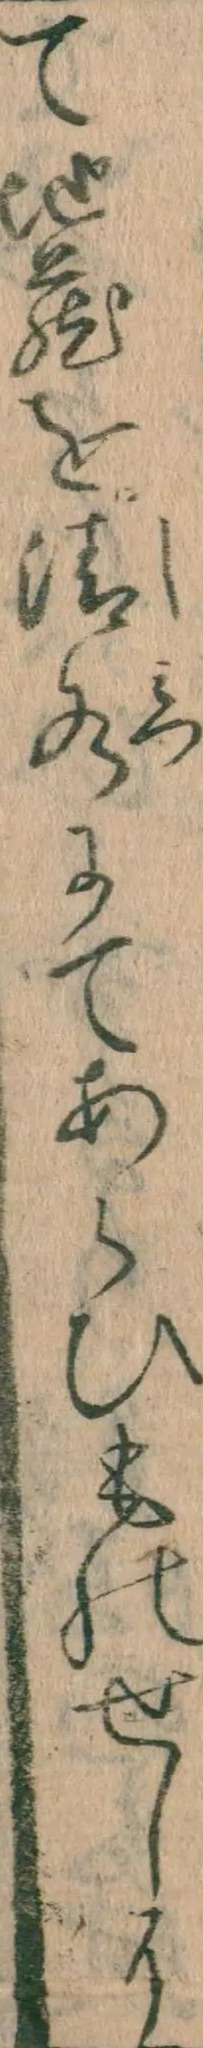て地蔵を清水にてあらひものせしに
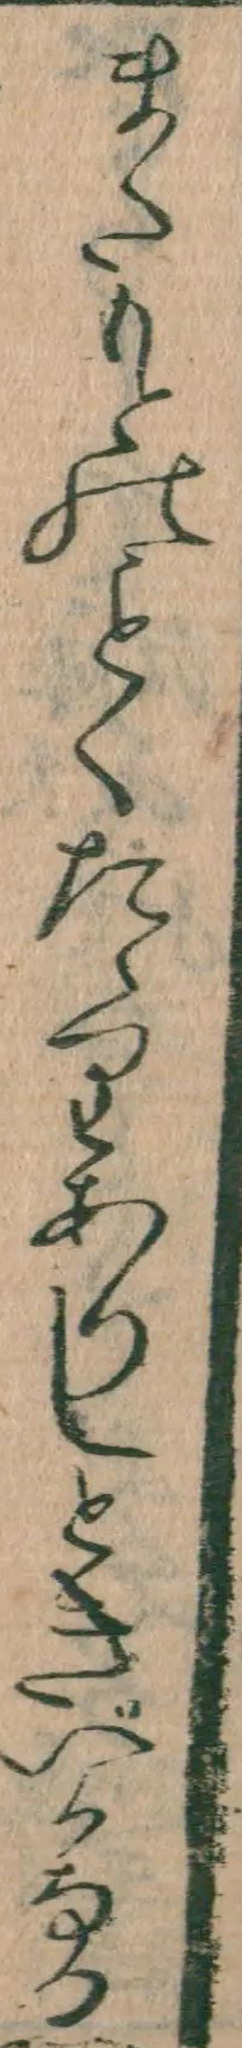またもとのことくたゝりありしとき。いかなる
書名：竹斎狂歌物語 3巻
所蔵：国立国会図書館 National Diet Library, JAPAN
